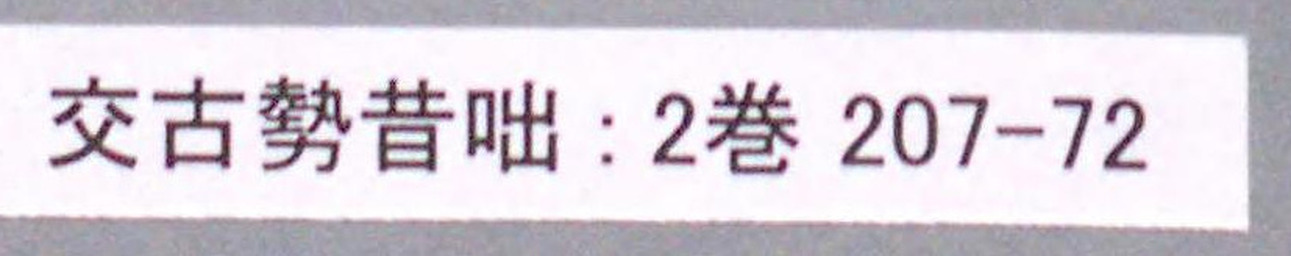交古勢昔噺全
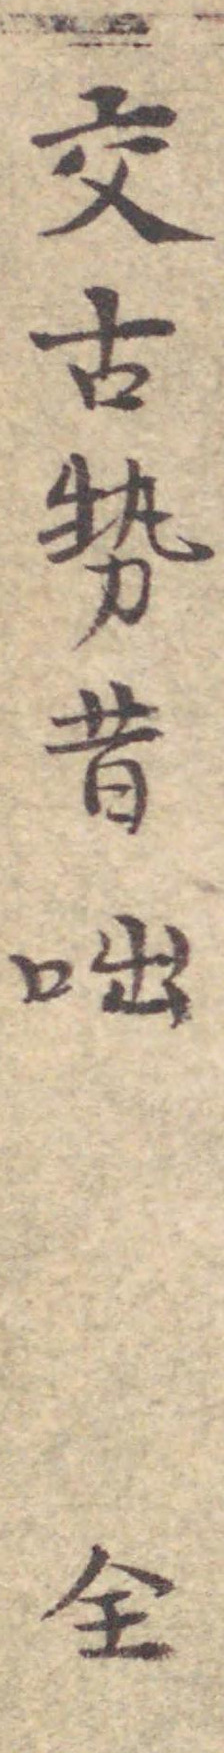交古勢昔噺全

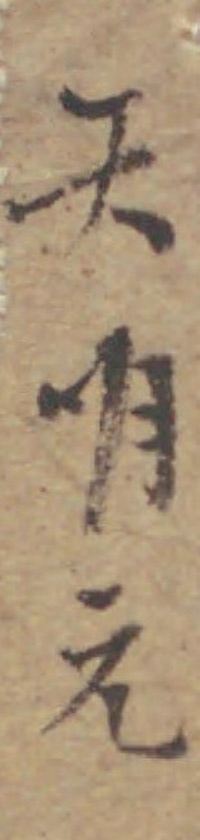天明元

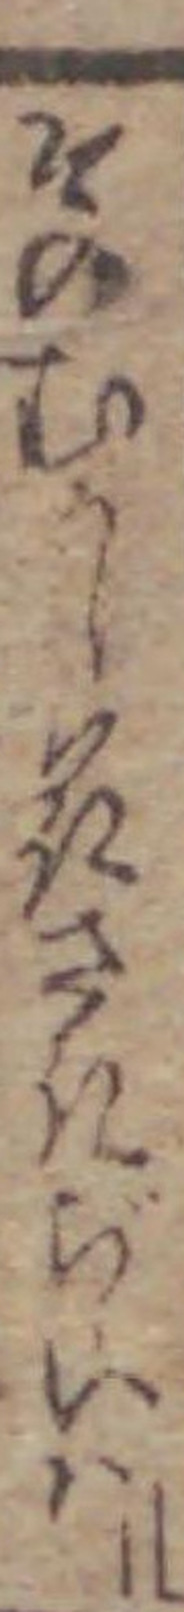そのむかし花さきぢゝいは
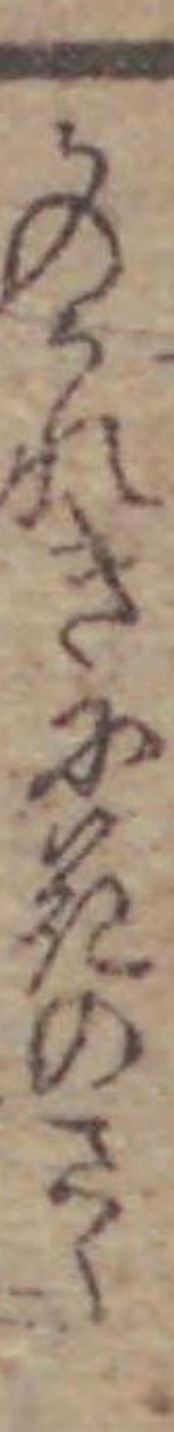かのかれきに花のさく
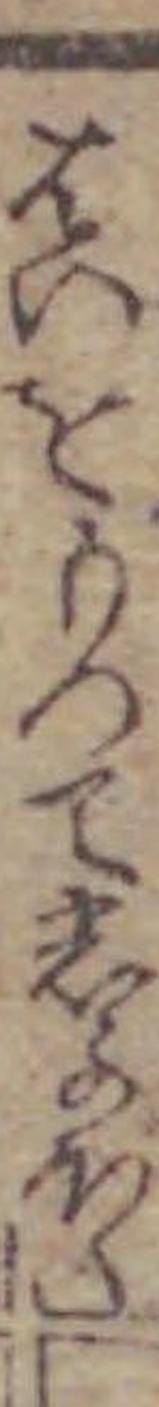はいをもつてしよぼく
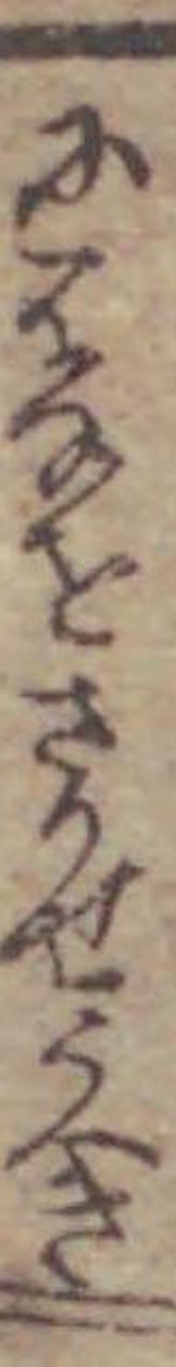にはなをさかせうへき
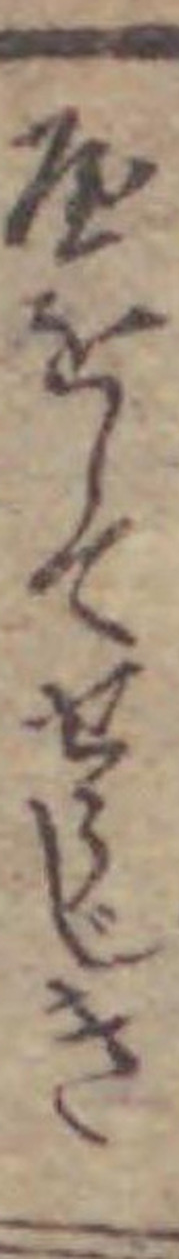屋をしてせうじき
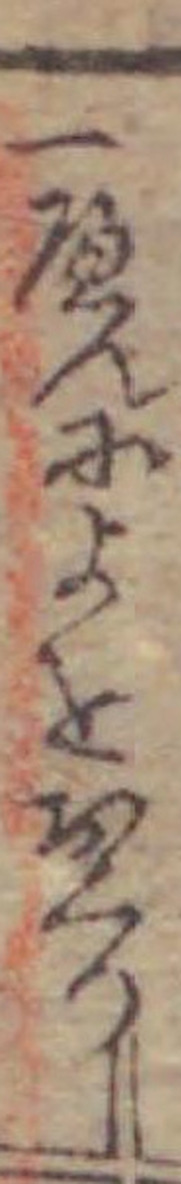一へんによをおくり
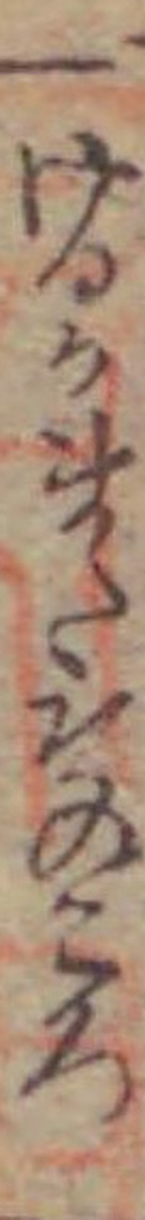けるかまたそのころ
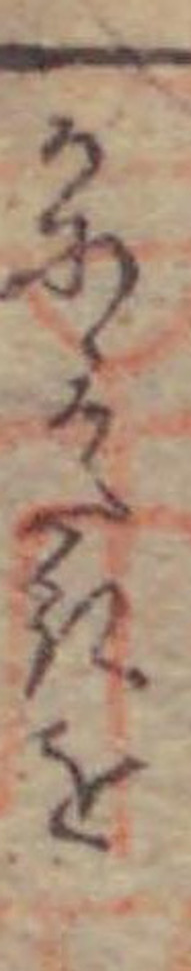かにゝかたきを
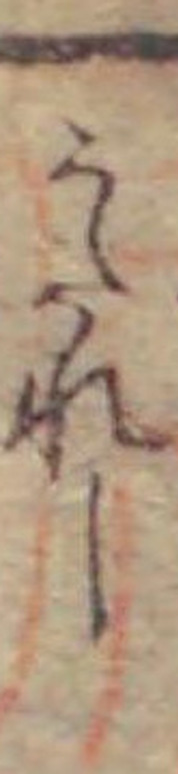うたれし
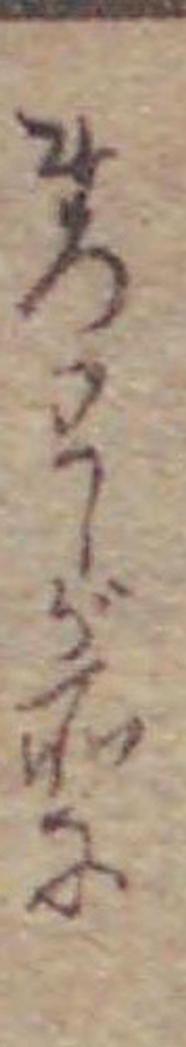まつわしが所に
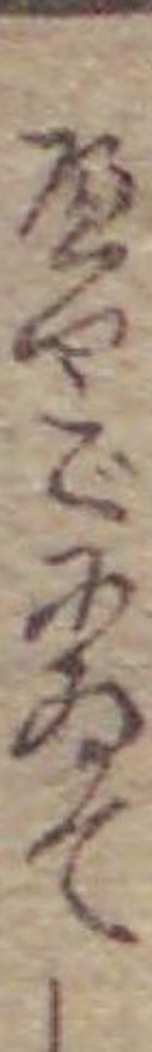へやごにゐて
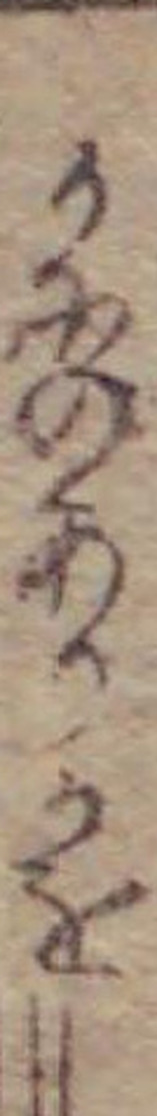かにのありかを
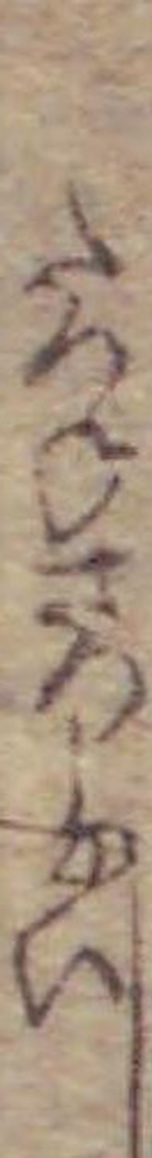たつねさつしやい
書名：交古勢昔咄 : 2巻
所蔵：国立国会図書館 National Diet Library, JAPAN
